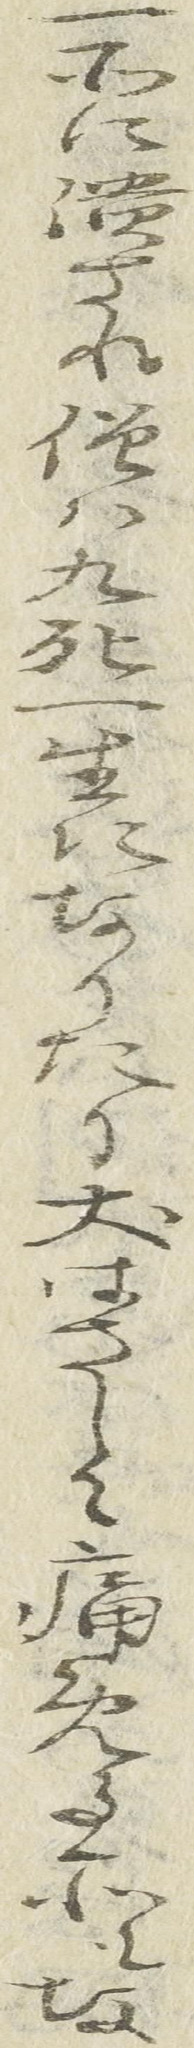一所に潰され僧は九死一生になりたり犬はさして痛める所もな
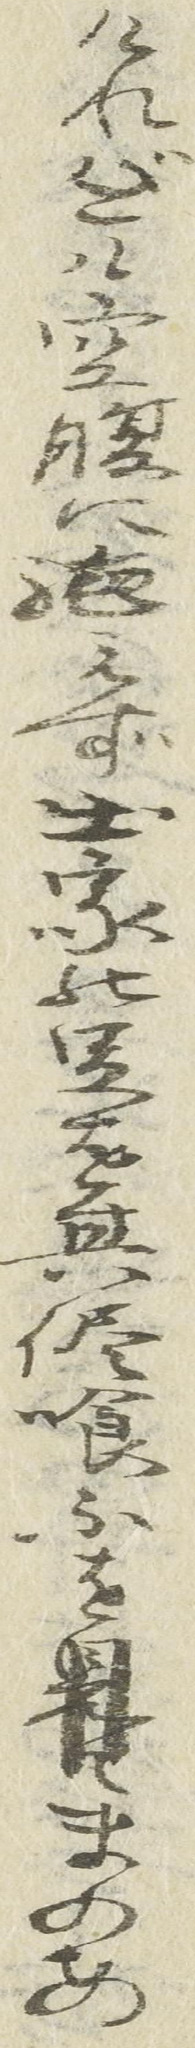けれバとも空腹に絶えず出家の足を其儘喰ふをまのあ
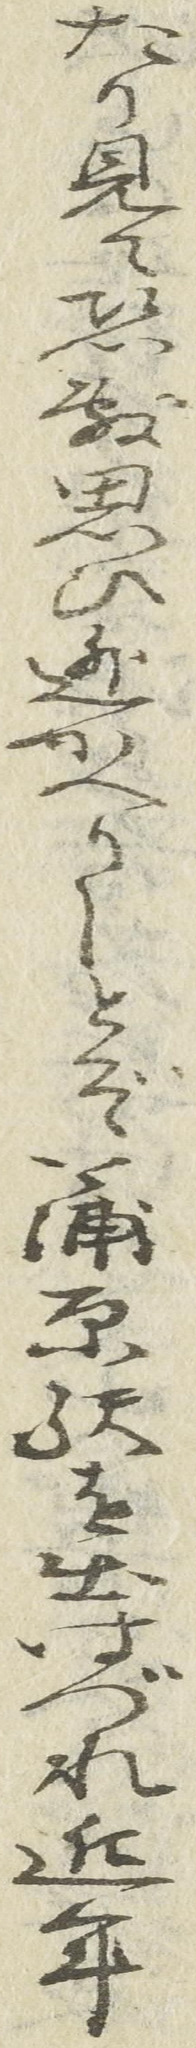たり見て恐敷思ひ逃かへりしとぞ蒲原駅を出はづれ近年
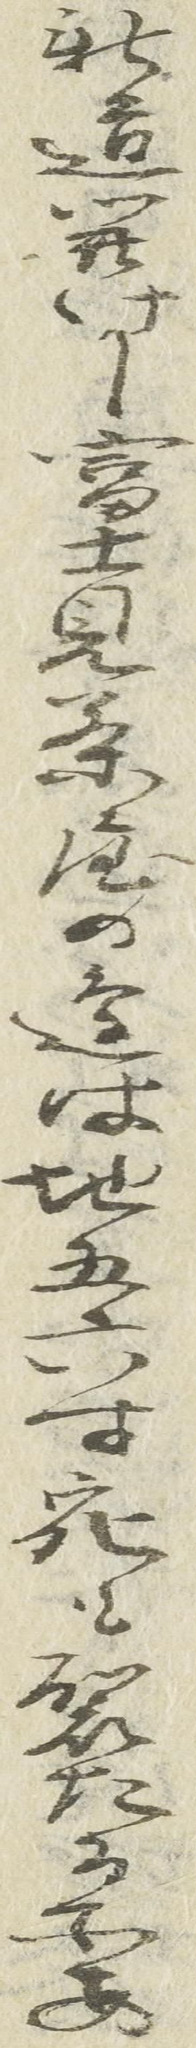新道開けし富士見茶屋の邊は地五六寸宛も裂たる所あ
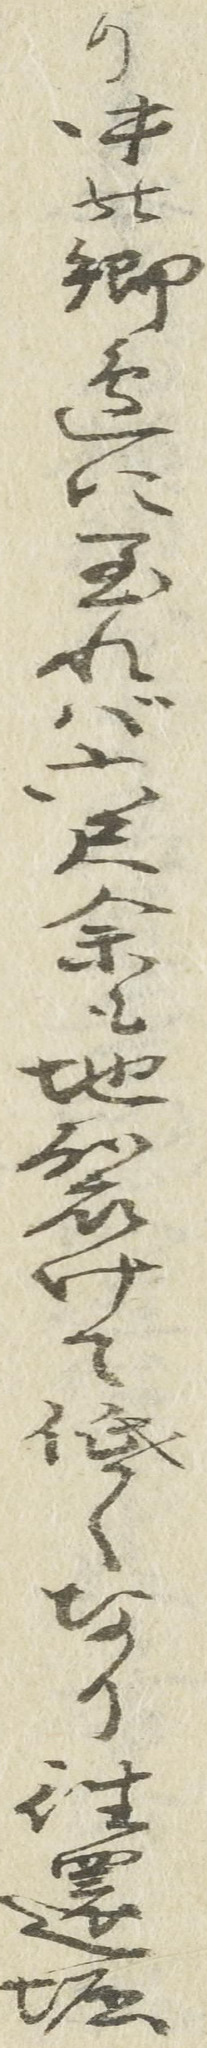り中の郷邊に至れバ六尺余も地裂けて低くなり往還堀
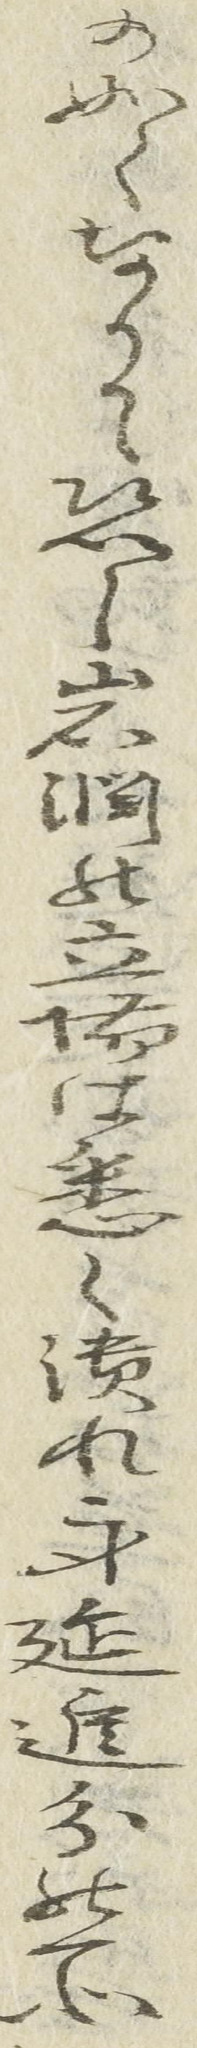の如くなりて恐し岩淵の立場は悉く潰れ身延追分の所
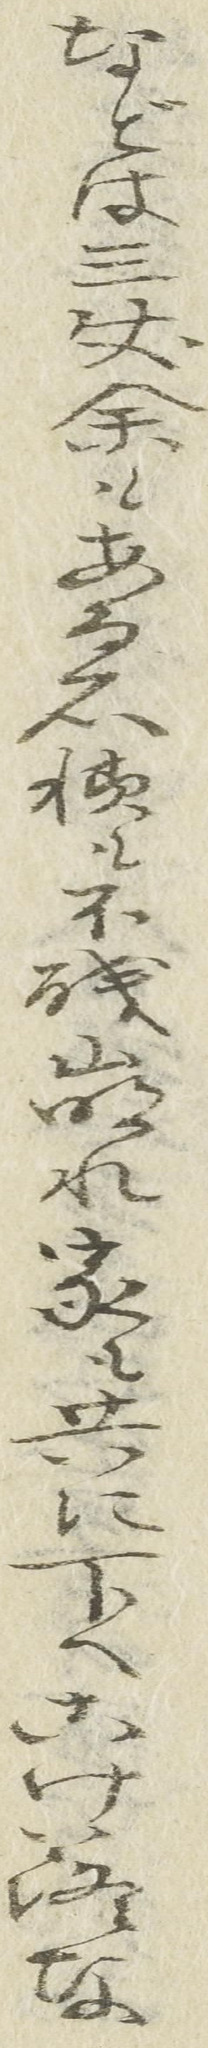などは三丈余もある石積も不残崩れ家も共に下へこけ落な
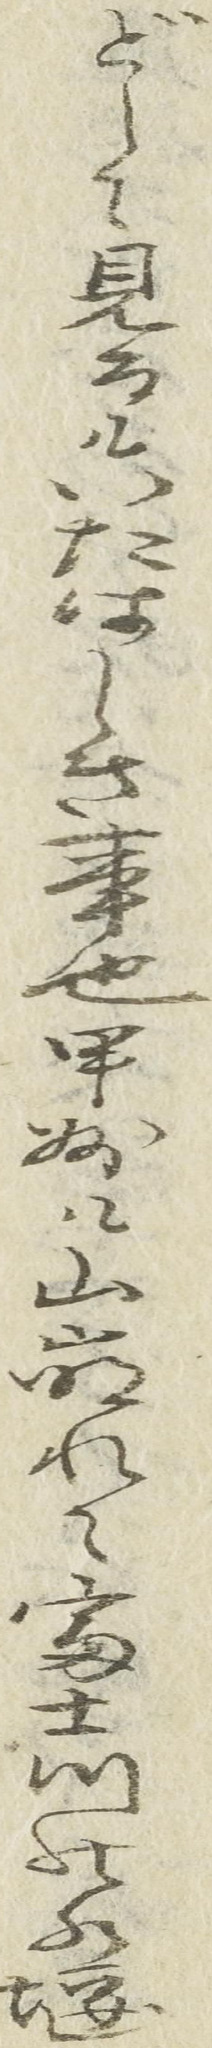どして見るもいたはしき事也甲州も山崩れて富士川の水堰
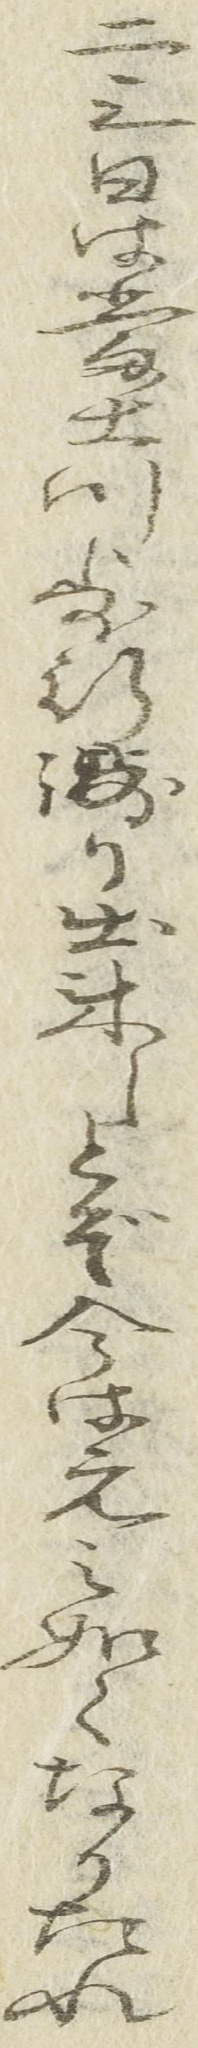二三日は富士川歩行渉り出来しとぞ今は元之如くなりたれ
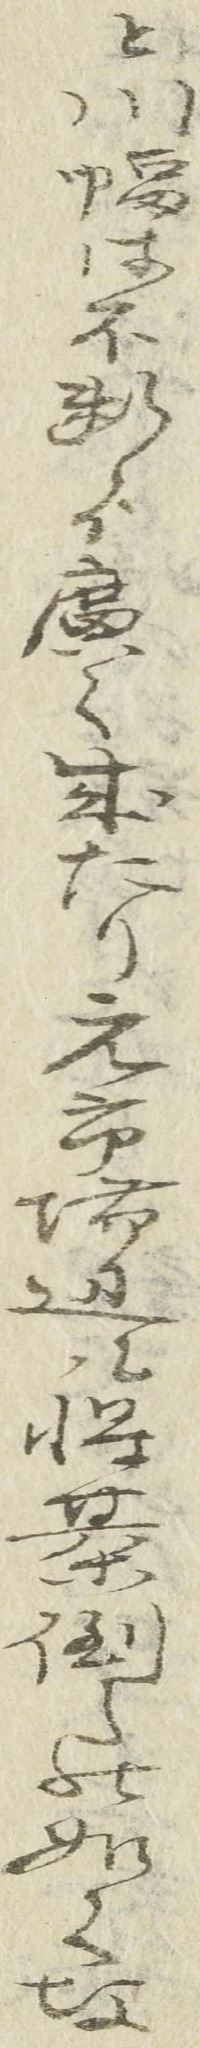と川幅は不断ゟ広く成たり元市場辺も将棊倒しの如くな
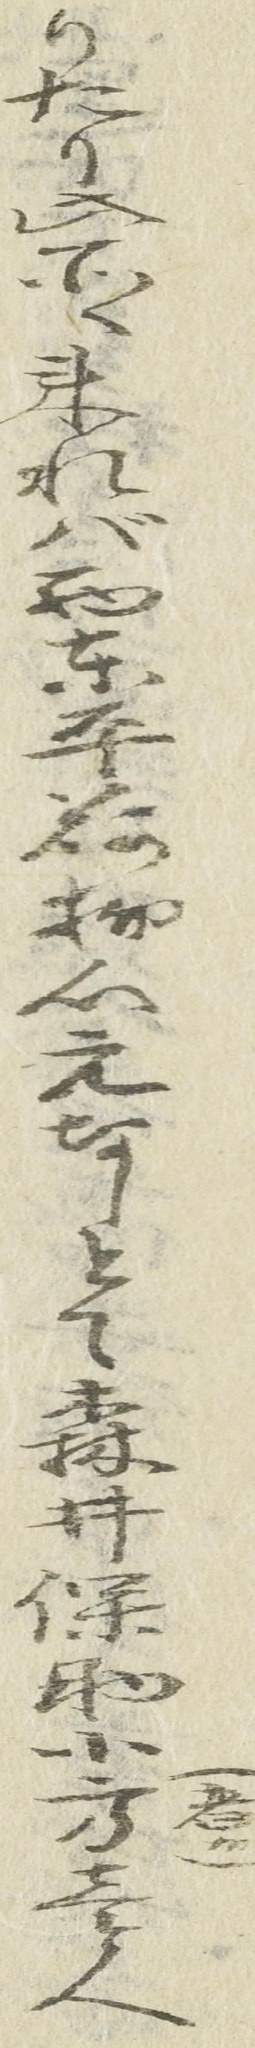りたり此所へ来れバ西東平荷物心元なしとて森井保助小方壱人
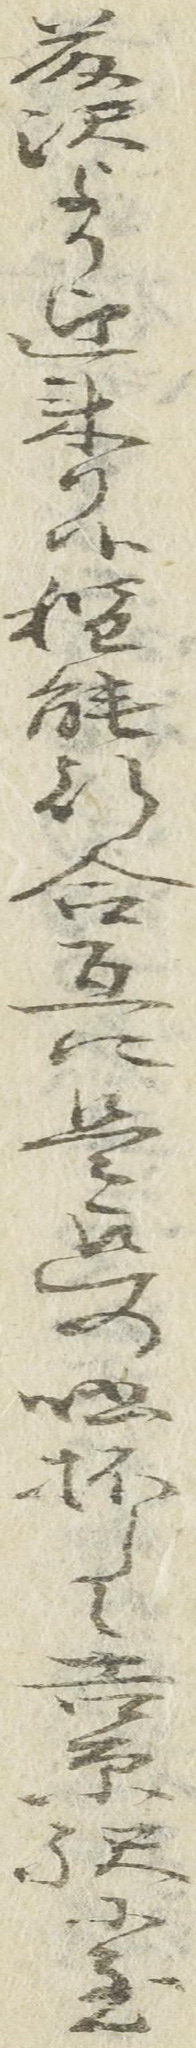藤沢より迎来り候程能行合互に是迄の咄抔して吉原駅に至
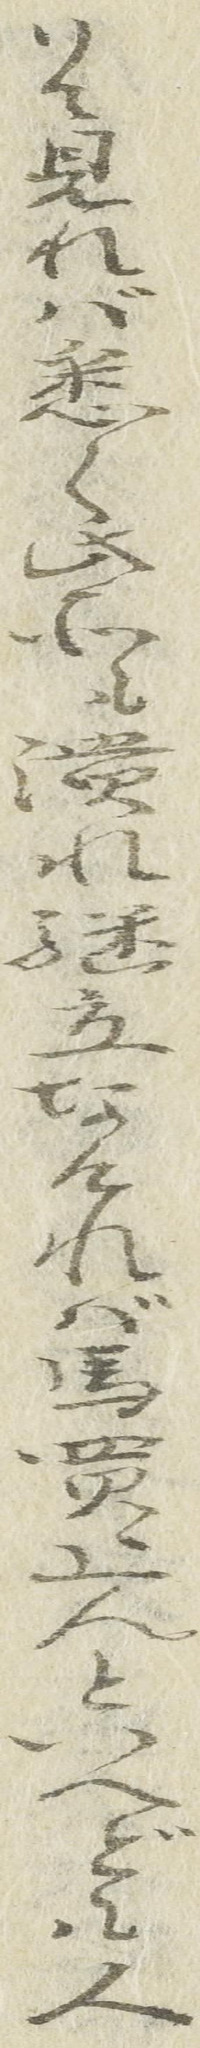りて見れバ悉く此所も潰れ継立なけれバ馬買上んといへども人
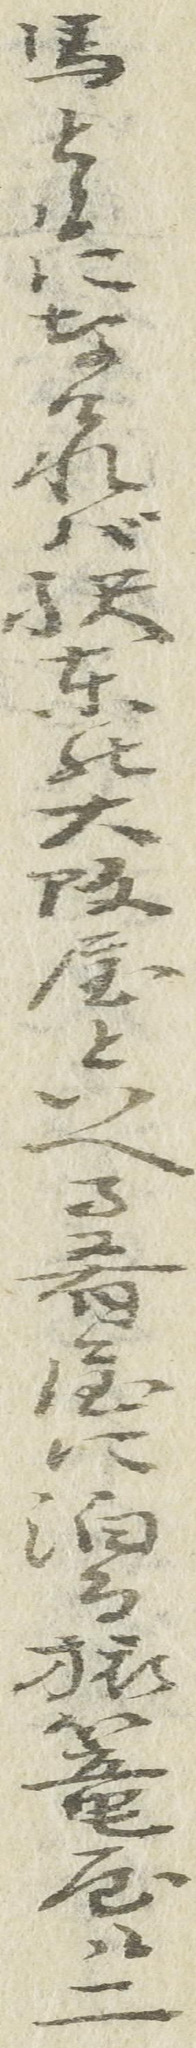馬ともになけれバ駅東の大阪屋といへる肴屋に泊る旅篭屋も二
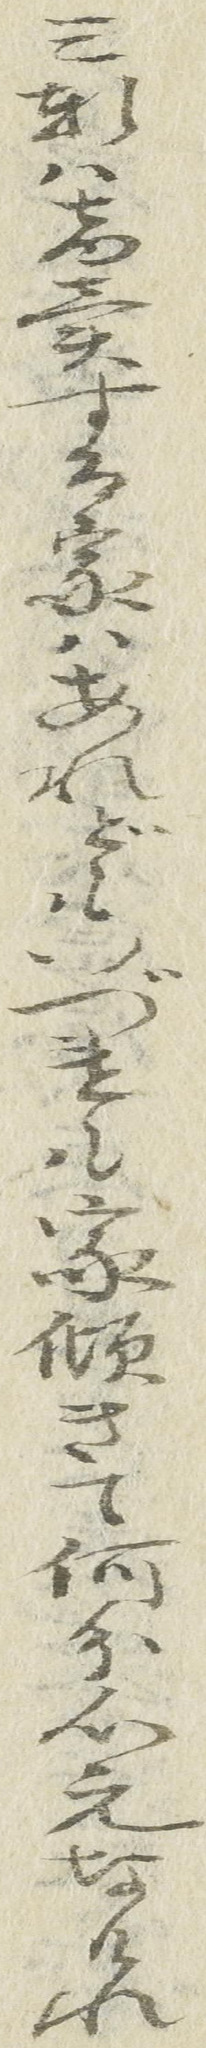三軒は商売する家はあれどもいづれも家傾きて何分心元なけれ
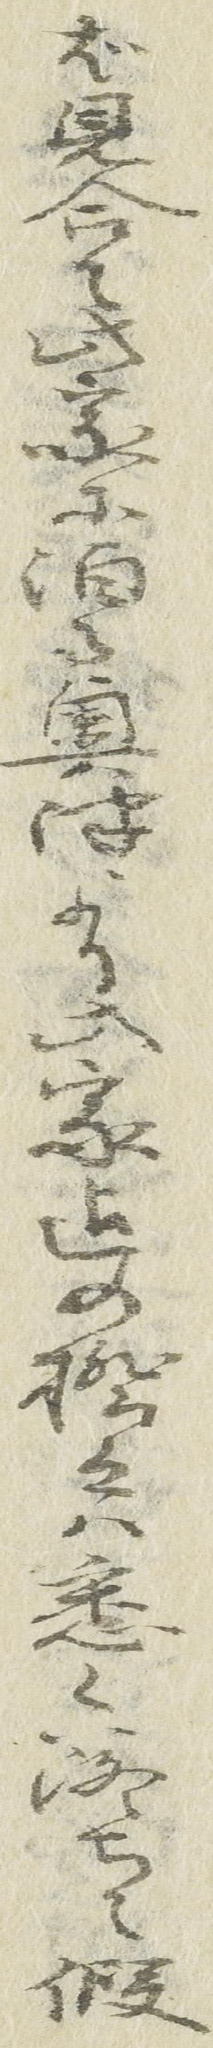ば見合て此家に泊る奥津より此家迄の橋々ハ悉く落ちて假
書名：地震前兆集　全
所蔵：東京大学地震研究所図書室 Earthquake Research Institute Library, The University of Tokyo, JAPAN
